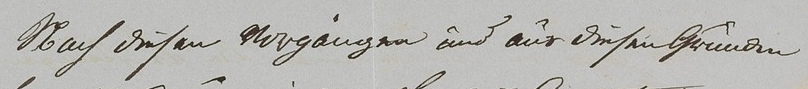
Nach diesen Vorgängen und aus diesen Gründen
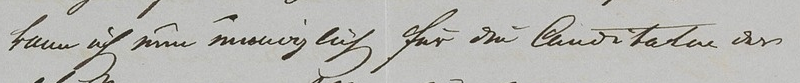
kann ich nun unmöglich für die Canditatur des
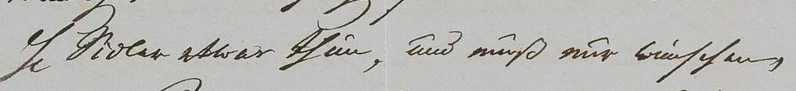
Hr. Sidler etwas thun, und muß nur wünschen,
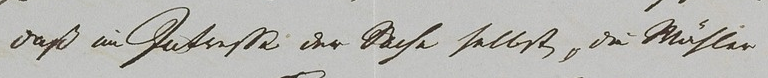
daß im Interesse der Sache selbst, die Wähler
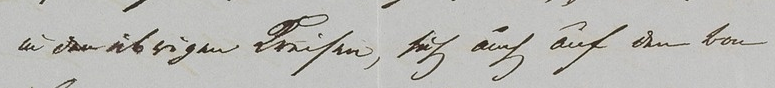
in den übrigen Kreisen, sich auch auf den von
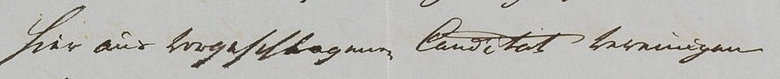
hier aus vorgeschlagenen Canditat vereinigen
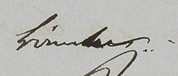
könnten.
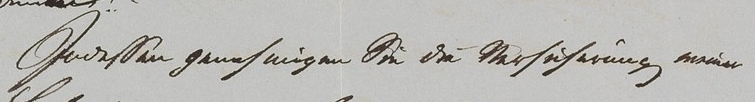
Indessen genehmigen Sie die Versicherung meiner
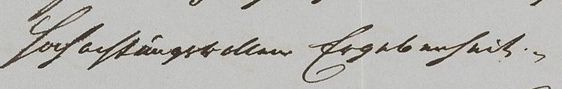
hochachtungsvollen Ergebenheit,
